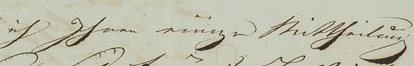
ich Ihnen einige Mittheilung
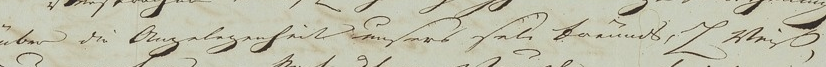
über die Angelegenheit unsers sel. Freunds, Herrn
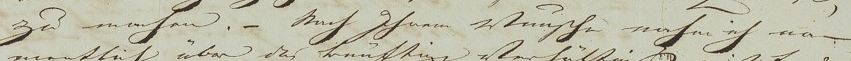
zu machen. ­ Nach Ihrem Wunsche nahm ich na-
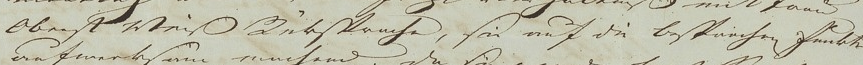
Oberst Rüksprache, sie auf die besprochenen Punkte
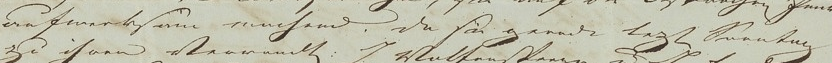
aufmerksam machend. Da sie gerade leztenSonntag
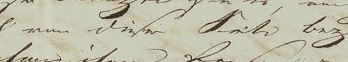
sie sich von dieser
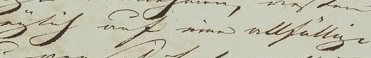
bezüglich auf eine allfällige
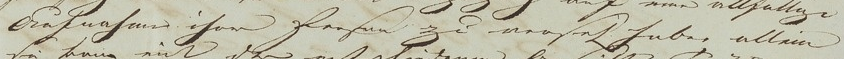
Aufnahme ihrer Person zu versehen habe, allein
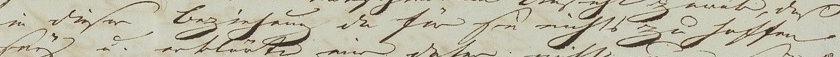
in dieser Beziehung da für sie nichts zu hoffen
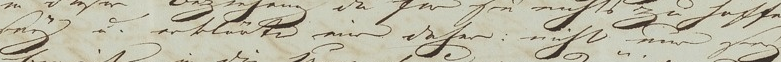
sey u. erklärte mir daher: nicht nur
